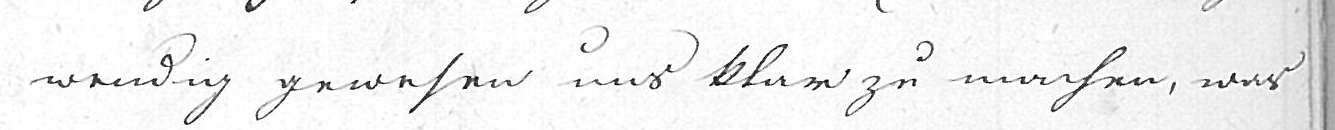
wendig gewesen uns klar zu machen, was
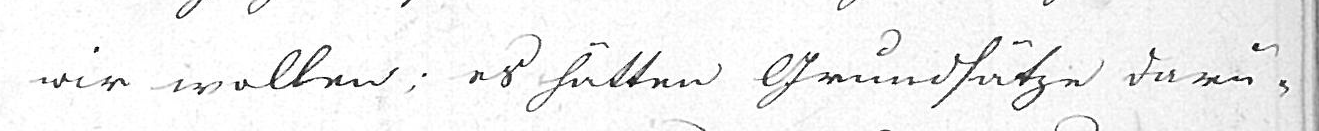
wir wollen; es hätten Grundsätze darü-
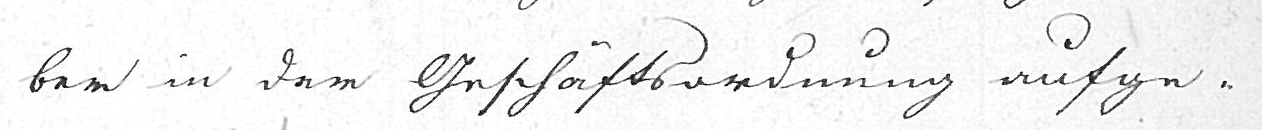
ber in der Geschäftsordnung aufge-
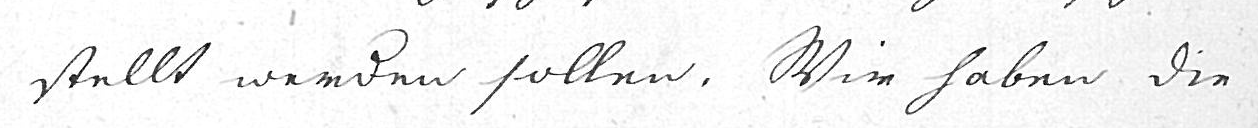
stellt werden sollen. Wir haben die
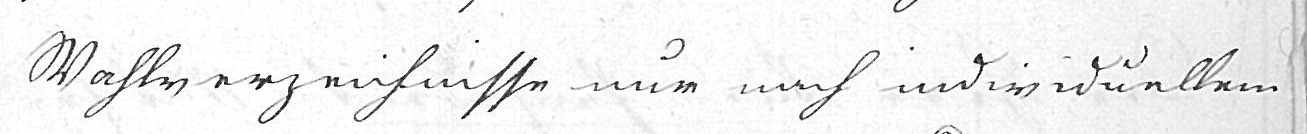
Wahlverzeichnisse nur nach individuellem
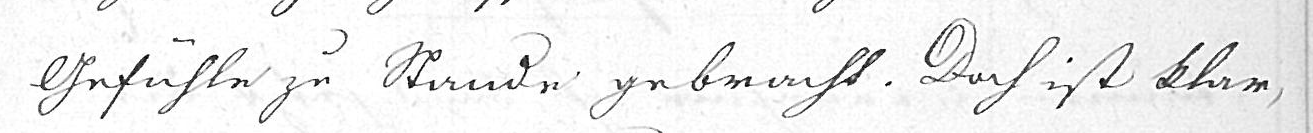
Gefühle zu Stande gebracht. Doch ist klar,
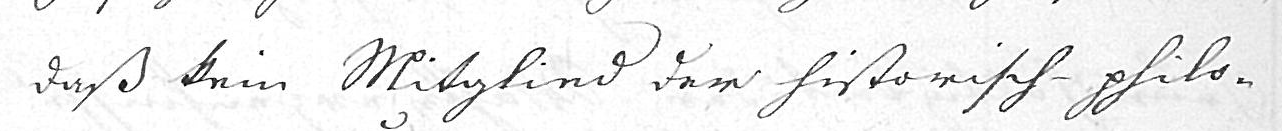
daß kein Mitglied der historisch-philo-
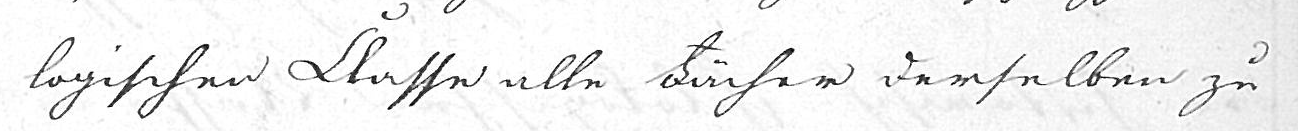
logischen Classe alle Fächter derselben zu
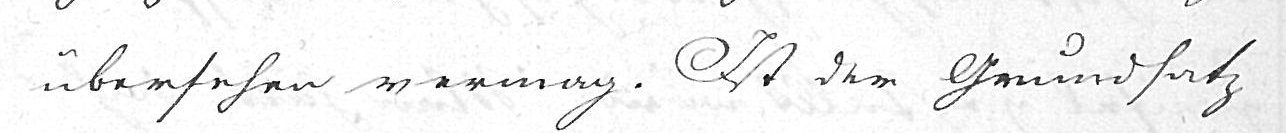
übersehen vermag. Ist der Grundsatz
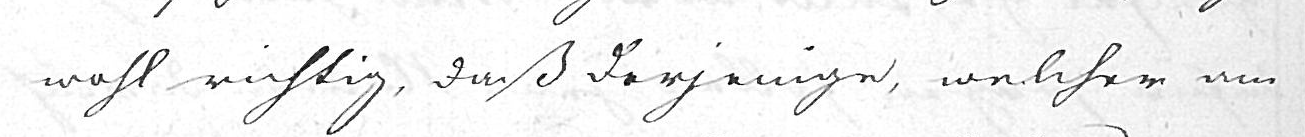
wohl richtig, daß derjenige, welcher am
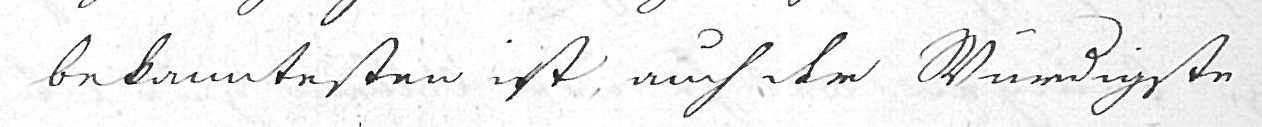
bekanntesten ist, auch der Würdigste
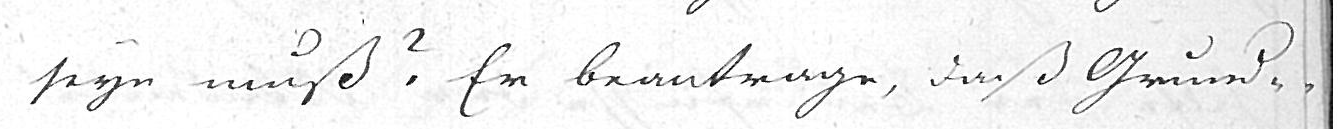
seyn muß? Er beantrage, daß Grund-
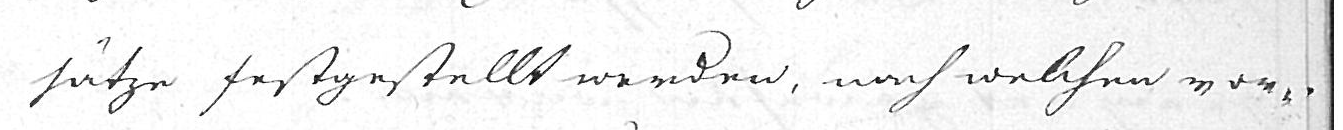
sätze festgestellt werden, nach welchen vor-
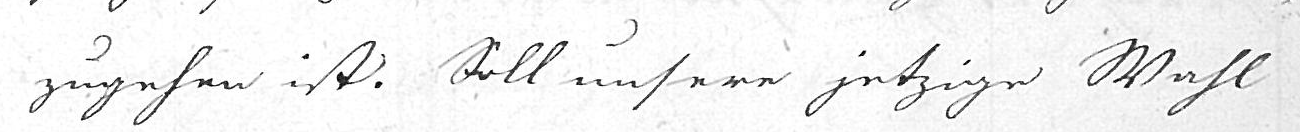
zugehen ist. Soll unsere jetzige Wahl
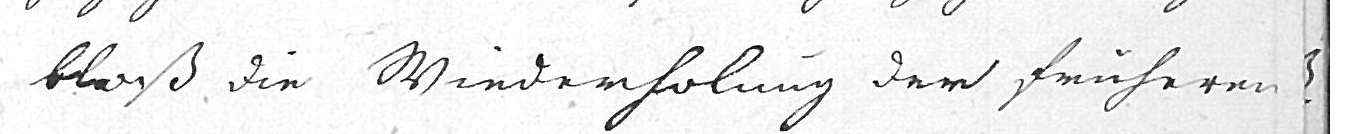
bloß die Wiederholung der früheren
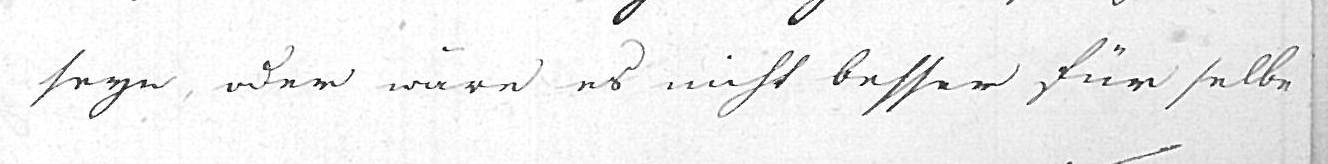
seyn, oder wäre es nicht besser für selbe
